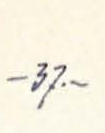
37.
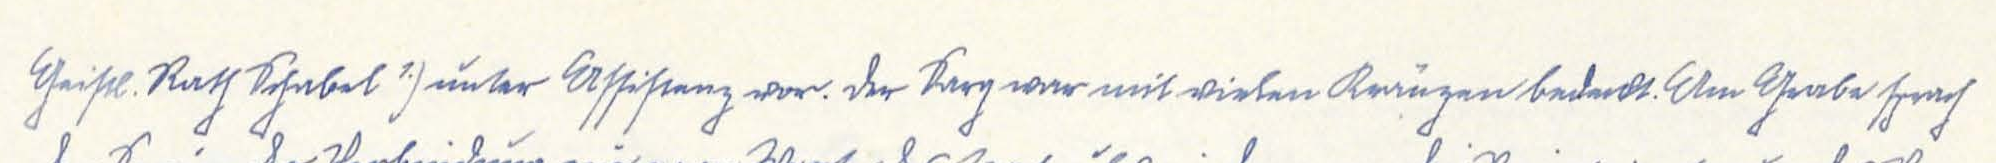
Geistl. Rath Schabel 1.) unter Assistenz vor. Der Sarg war mit vielen Kränzen bedeckt. Am Grabe sprach
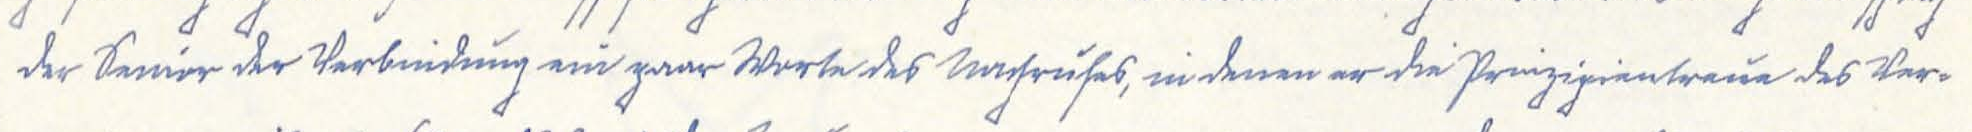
der Senior der Verbindung ein paar Worte des Nachrufes, in denen er die Prinzipientreue des Ver-
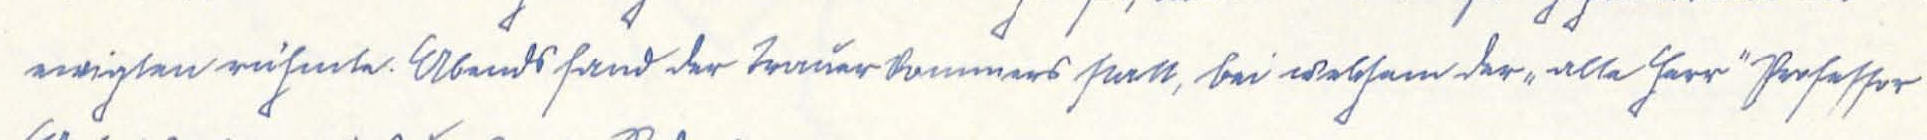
ewigten rühmte. Abends fand der Trauerkommers statt, bei welchem der "alte Herr" Professor
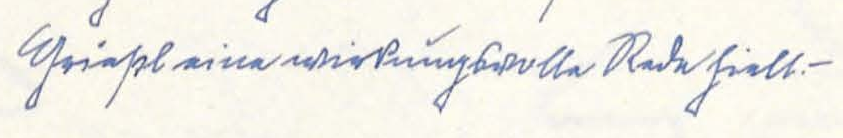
Grießl eine wirkungsvolle Rede hielt.-
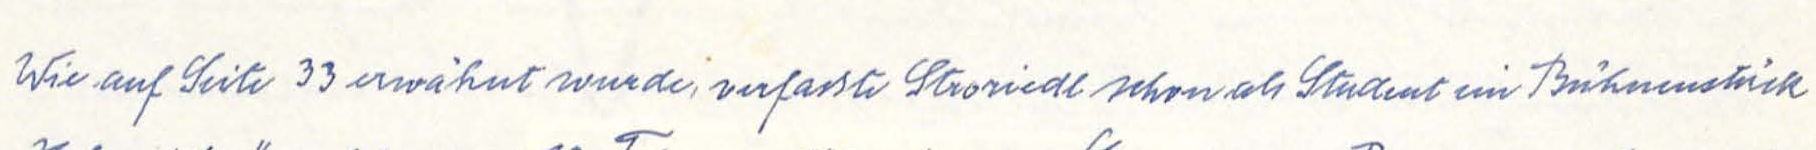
Wie auf Seite 33 erwähnt wurde, verfasste Stroriedl schon als Student ein Bühnenstück
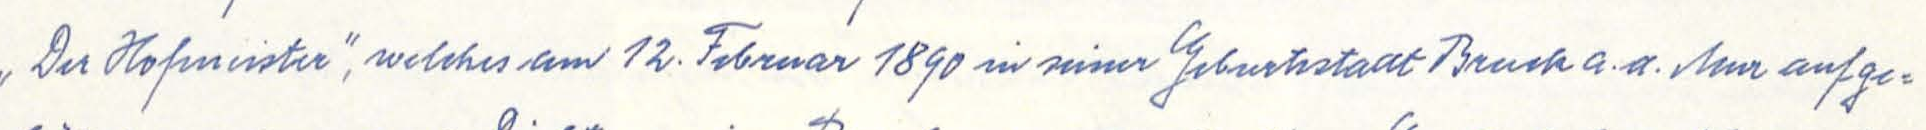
"Der Hofmeister", welches am 12. Februar 1890 in seiner Geburtsstadt Bruck a. d. Mur aufge-
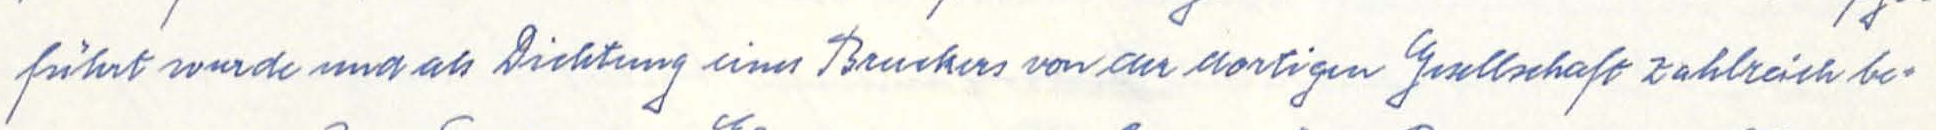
führte wurde und als Dichtung eines Bruckers von der dortigen Gesellschaft zahlreich be-
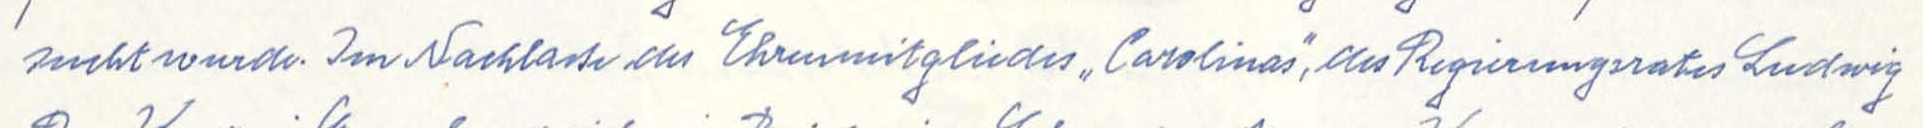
sucht wurde. Im Nachlaße des Ehrenmitglieder „Carolinas, des Regierungsrates Ludwig
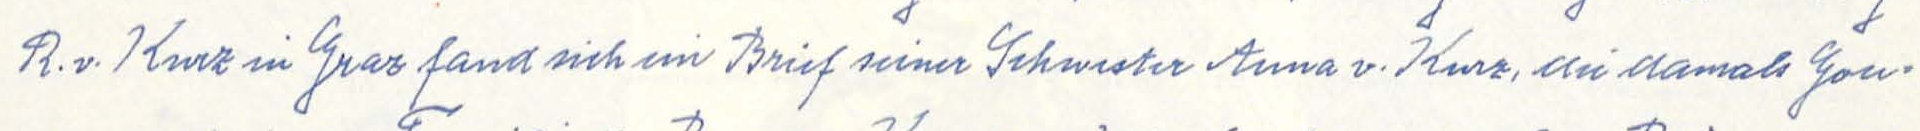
R. v. Kurz in Graz fand sich ein Brief seiner Schwester Anna v. Kurz, die damals Gou-
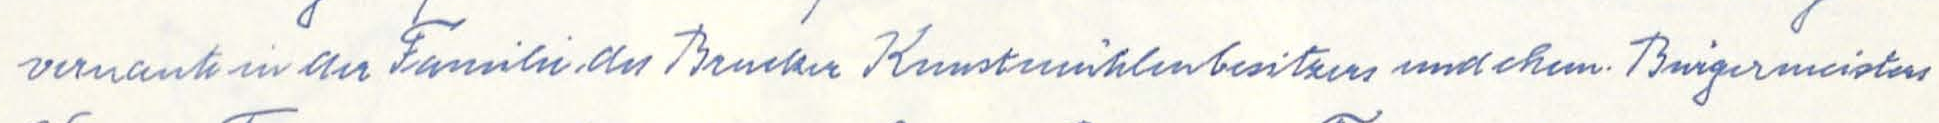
vernante in der Familie des Brucker Kustmühlenbesitzers und ehem. Bürgermeisters
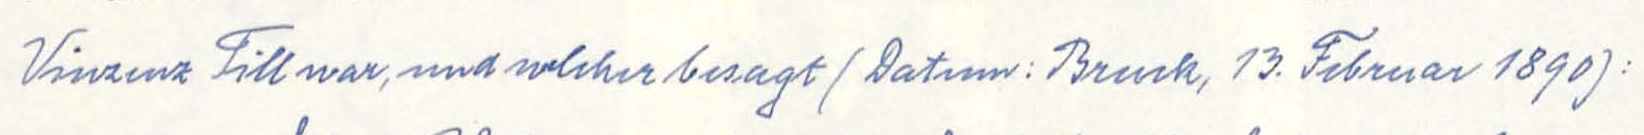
Vinzenz Till war, und welcher besagt (Datum: Bruck, 13. Februar 1890):
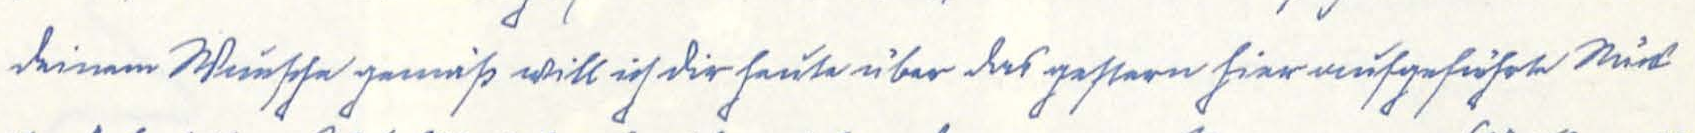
Deinem Wunsche gemäß will ich dir heute über das gestern hier aufgeführte Stück
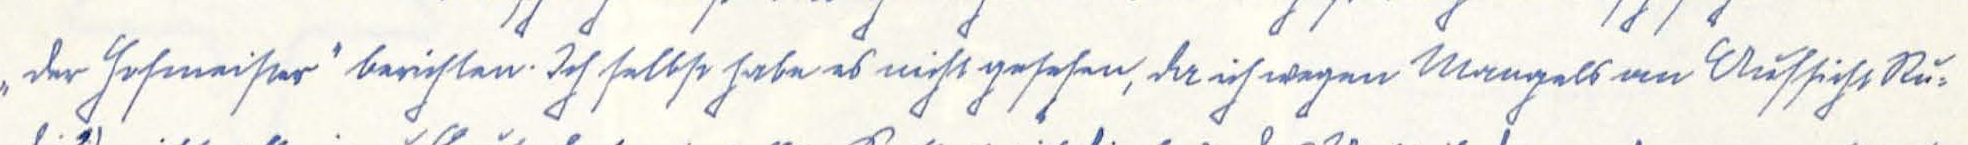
"Der Hofmeister“ berichten. Ich selbst habe es nicht gesehen, da ich wegen Mangels an Aufsicht Ru-
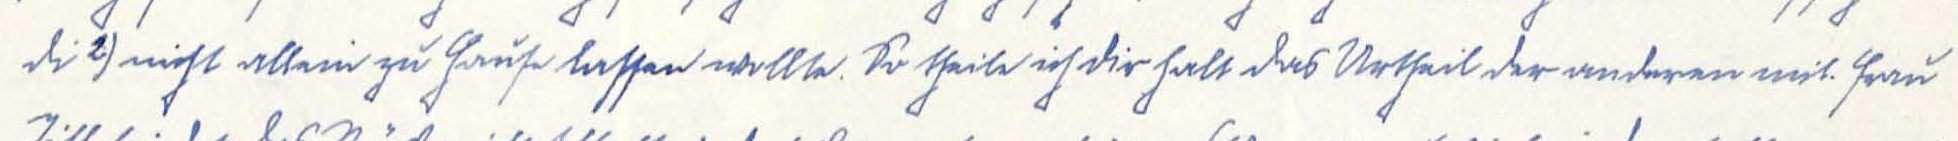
di nicht allein zu Hause lassen wollte. So teile ich dir halt das Urteil der anderen mit. Frau
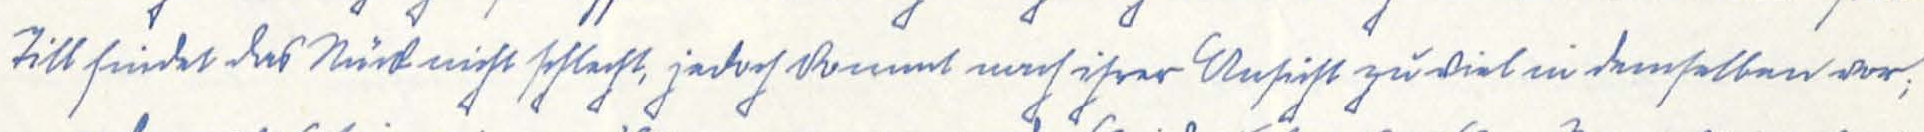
Till findet das Stück nicht schlecht, jedoch kommt nach ihrer Ansicht zu viel in demselben vor;
